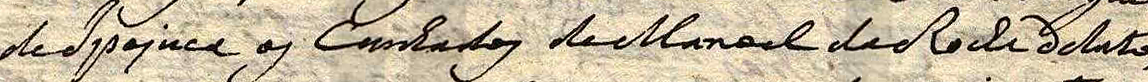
de Ipojuca os Cunhados de Manoel da Rocha delato,
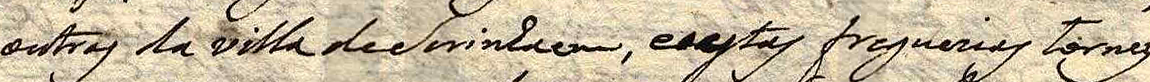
outras da villa de Serinhaem, e a estas freguezias torney
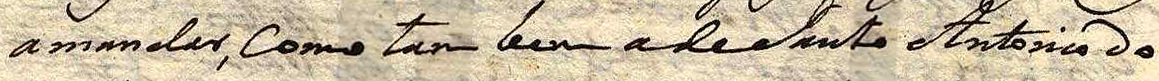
a mandar, Como tambem a de Santo Antonio do
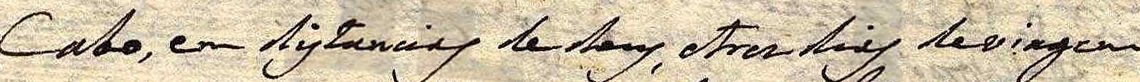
Cabo, em distancias de dous, e trez dias de viagem
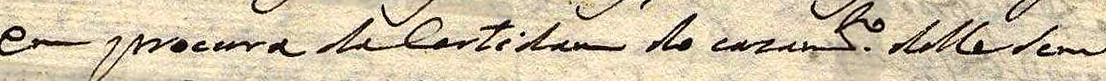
em procura de Certidam do cazamto. delle sem
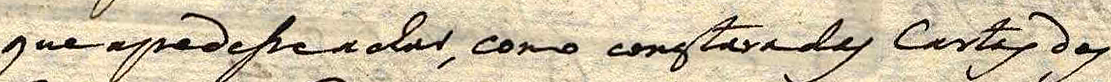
que a podesse achar, como constara das Cartas dos
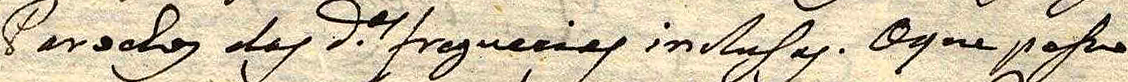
Parochos das d.as freguezias inclusas. O que posso
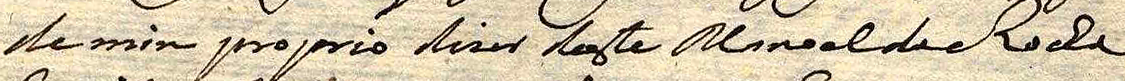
de min proprio dizer deste Manoel da Rocha
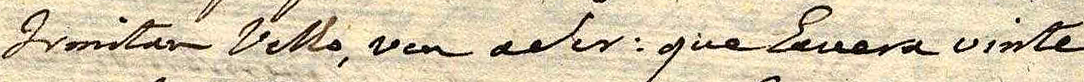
Irmitan Velho, ven a ser: que havera vinte
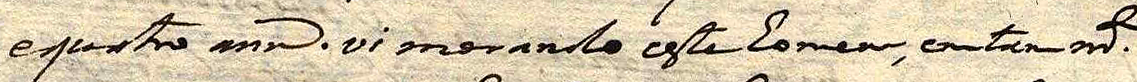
e quatro ann̄. vi morando este homem, emtan m.to
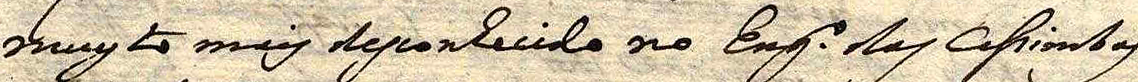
muyto mais desconhecido no Eng.o das Cassimbas
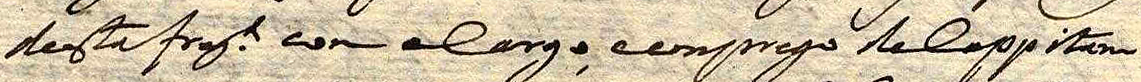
desta freg.a con o Cargo, e emprego de Cappitam
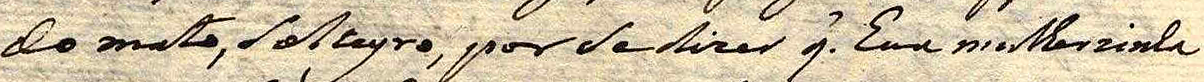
do mato, solteyro, por se dizer q̄ hua mulherzinha
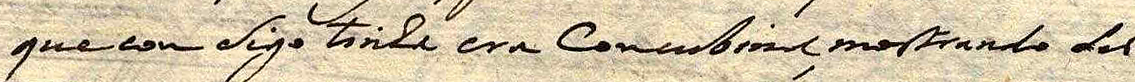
que consigo tinha era Concubina, e mostrando dar
